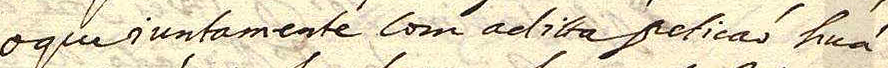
o que iuntamente com a ditta peticaõ huā
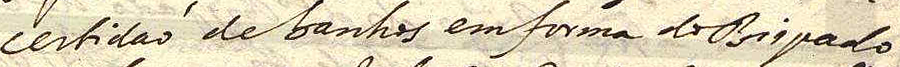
certidaõ de banhos em forma do Bispado
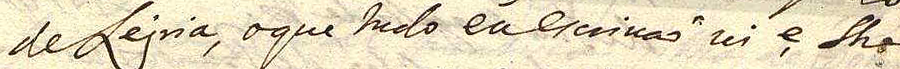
de Leiria, o que tudo eu escriuaõ ui, e lhe
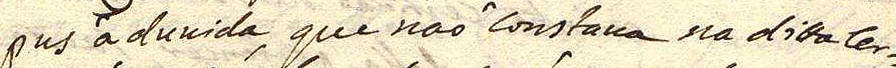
pus ā duuida, que naõ constaua na ditta cer
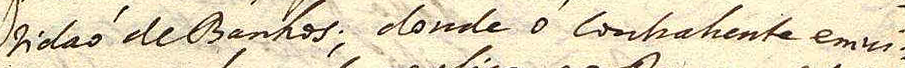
tidaõ de Banhos, donde ó contrahente emui
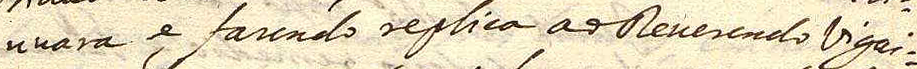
uuara, e fazendo replica ao Reuerendo Vigai
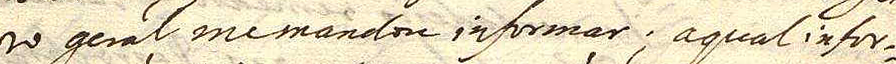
ro geral me mandou informar; a qual infor
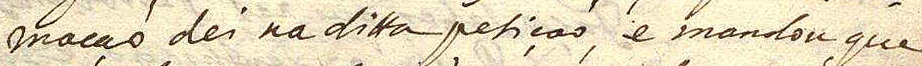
maçaõ dei na ditta petiçaõ, e mandou, que
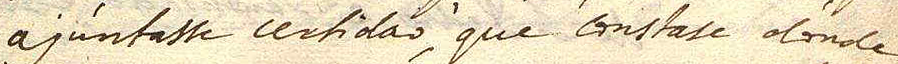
ajuntasse certidaõ, que constase donde
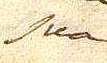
sua
